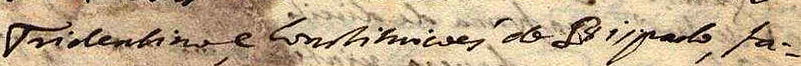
Tridentino, e Constituiçoẽs do Bispado, fa
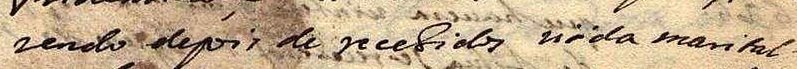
zendo depois de recebidos uida marital
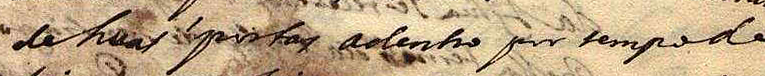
de huas portas adentro por tempo de
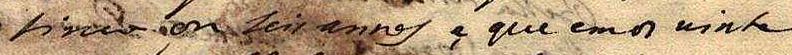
sinco, ou seis annos, e que em os uinte
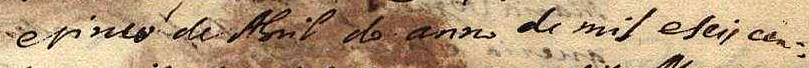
e sinco de Abril do anno de mil e seiscen
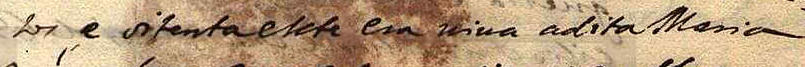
tos, e oitenta e sete era uiua a dita Maria
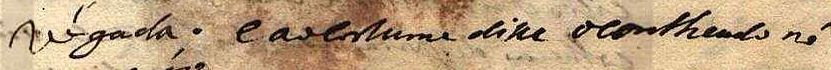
Vogada; e ao costume disse o contheudo no
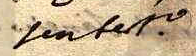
seu test.o
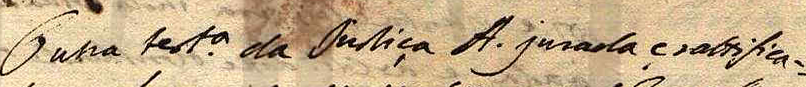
Outra test.a da Iustiça A. jurada, e ratifica
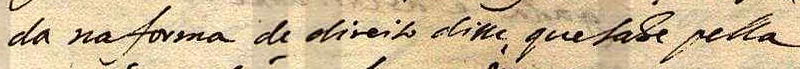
da na forma de direito disse, que sabe pella
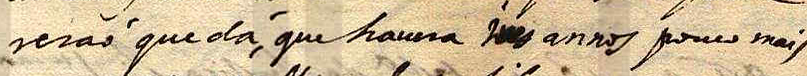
rezaõ que dá, que hauera tres annos pouco mais
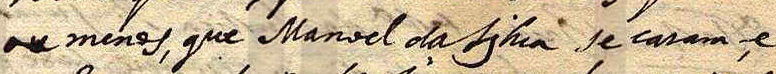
ou menos, que Manoel da Sjlua, se cazara, e
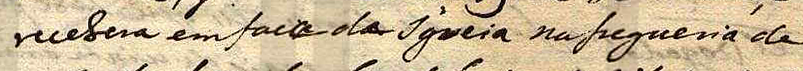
recebera em facce da Igreia na freguezia de
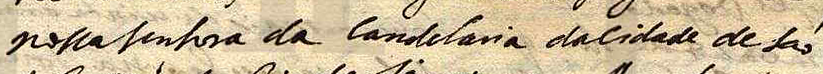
nossa Senhora da Candelaria da cidade de Saõ
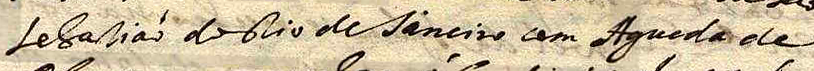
Sebastiaõ do Rio de Ianeiro com Agueda de
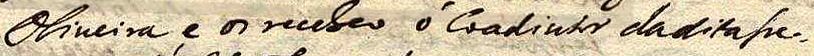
Oliueira, e os recebeo o Coadiutor da dita fre
